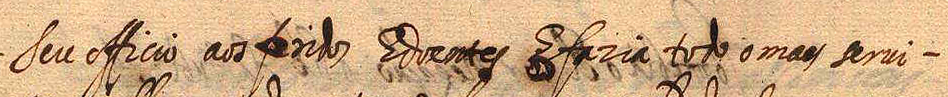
Seu officio aos feridos E doentes E fazia todo o maes serui
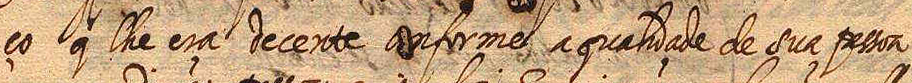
ço q̄ lhe era decente conforme a qualidade de sua pessoa
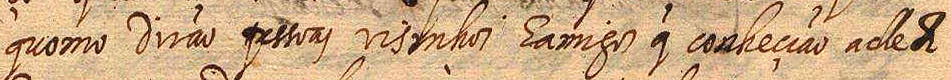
quomo dirão pessoas visinhos E amigos q̄ conheçião a elle R
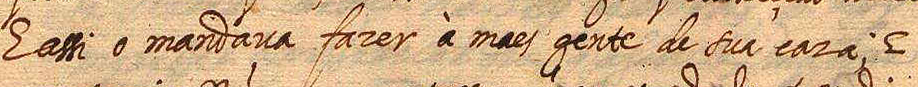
E assi o mandaua fazer a maes gente de sua caza; E
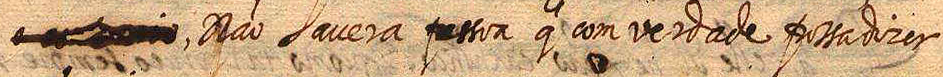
_, não auera pessoa q̄ com verdade possa dizer
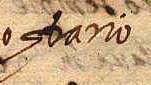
o ꝯtrario
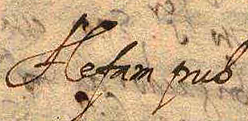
He fam pub
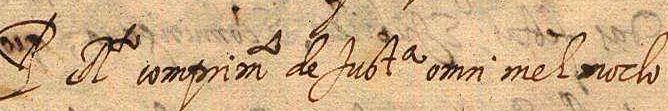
P Rto comprimto de Justa omni mel modo
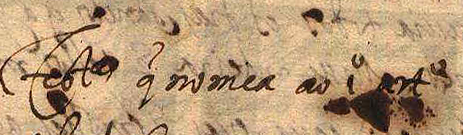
Testas q̄ nomea ao 1o arto
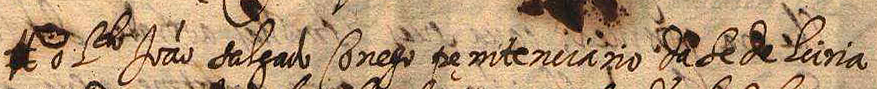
# o Ldo João salgado Conego penitenciario da Se de Leiria
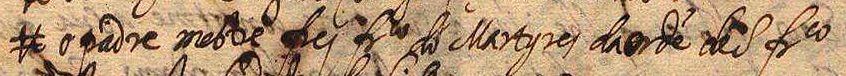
# o padre meste frej frco do Martyres da ordē de S frco
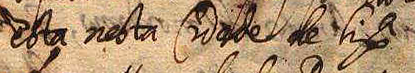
esta nesta Cidade de lixa
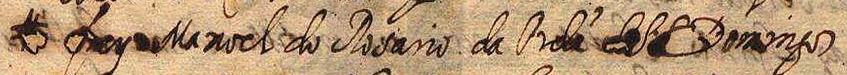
# frey Manoel do Rosario da Ordē de S Domingos
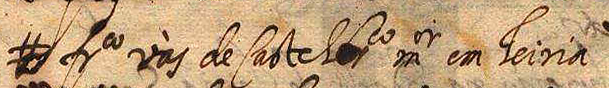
# frco vas de Castel brco mor em Leiria
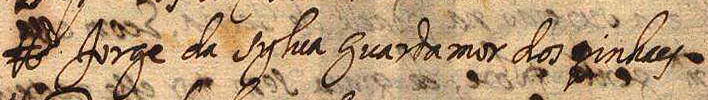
# Jorge da Sylua guarda mor dos pinhaes
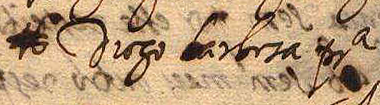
# diogo barboza pra
